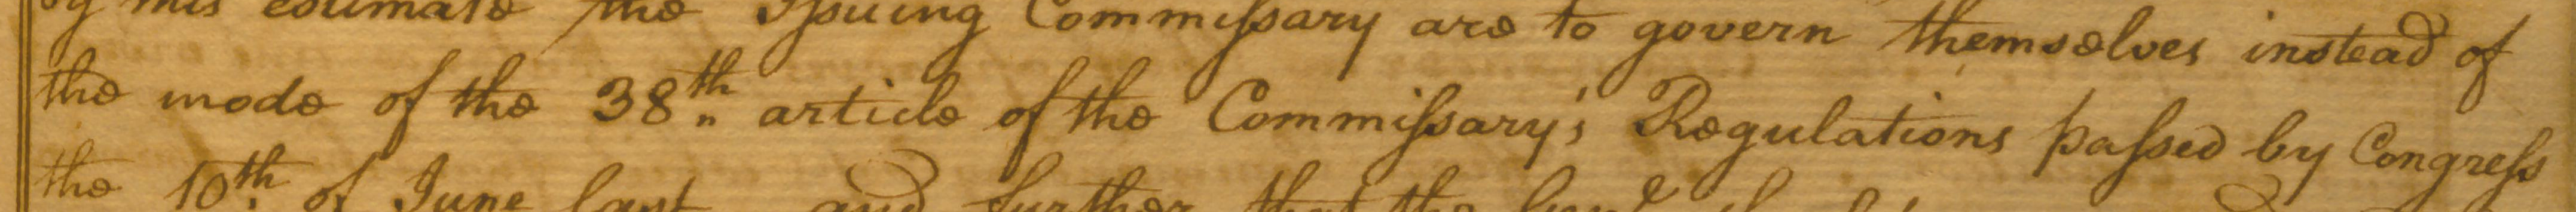the mode of the 38^th. article of the Commissary's Regulations passed by Congress
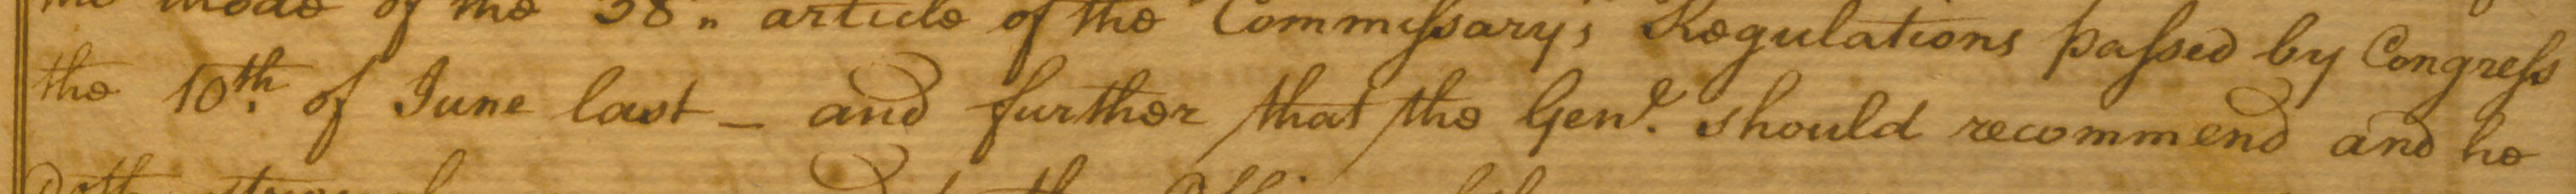the 10^th. of June last- and further that the Gen^l. should recommend and he
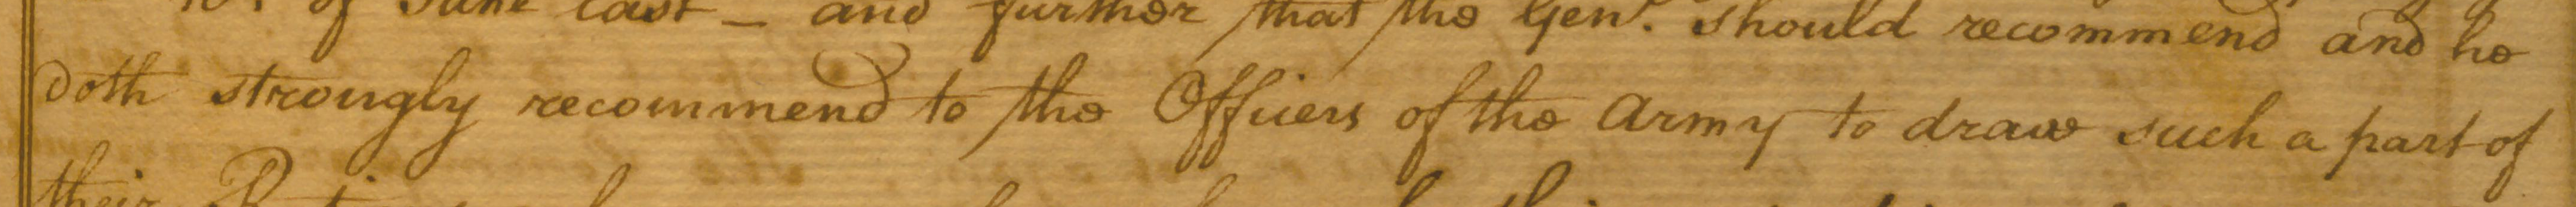doth strongly recommend to the Officers of the army to draw such a part of
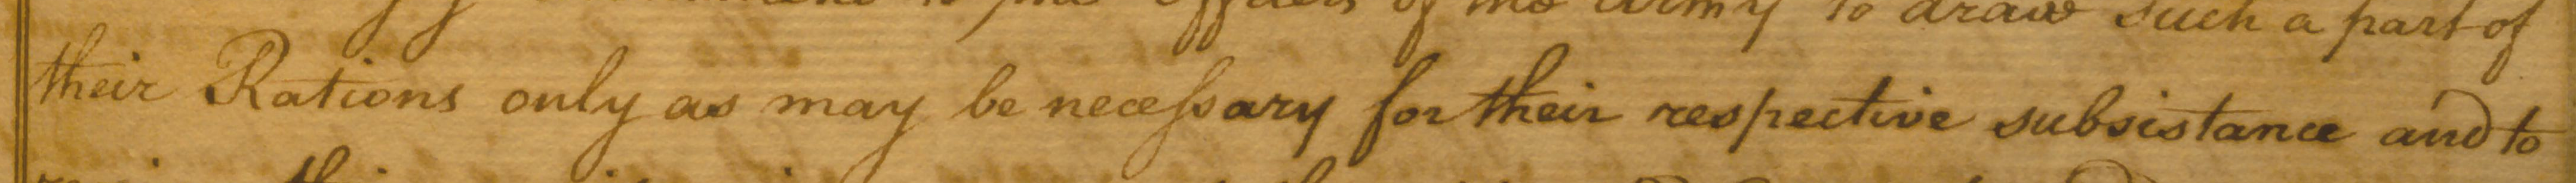their Rations only as may be necessary for their respective subsitance and to
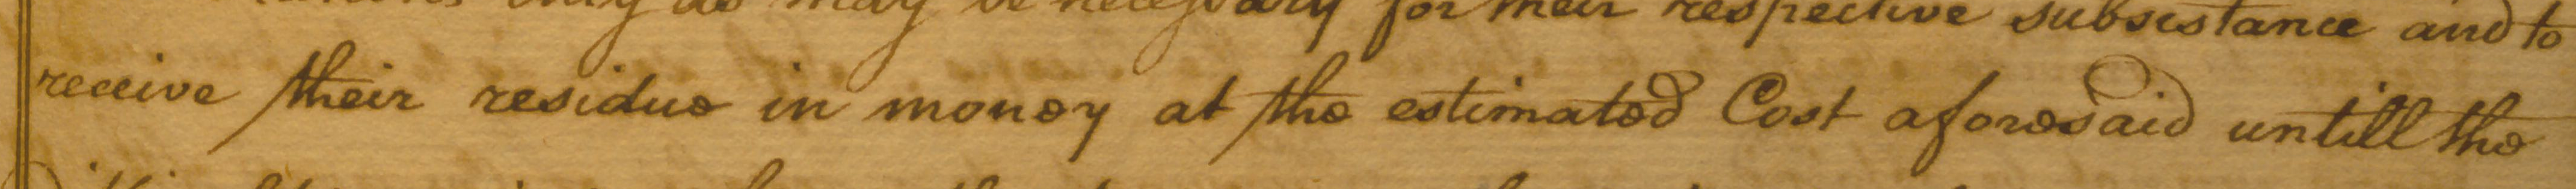receive their residue in money at the estimated Cost aforesaid untill the
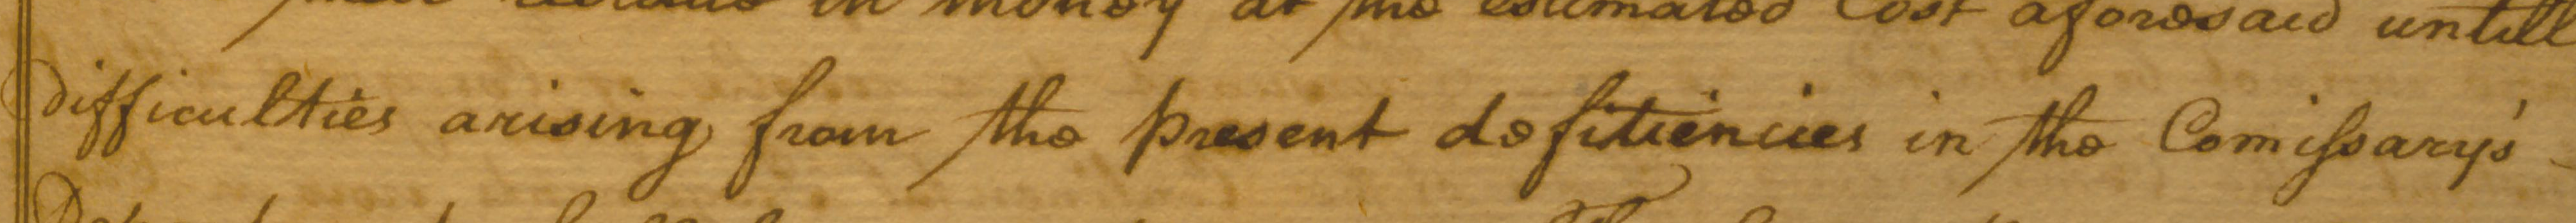difficulties arising from the present defitiencies in the Comissary's
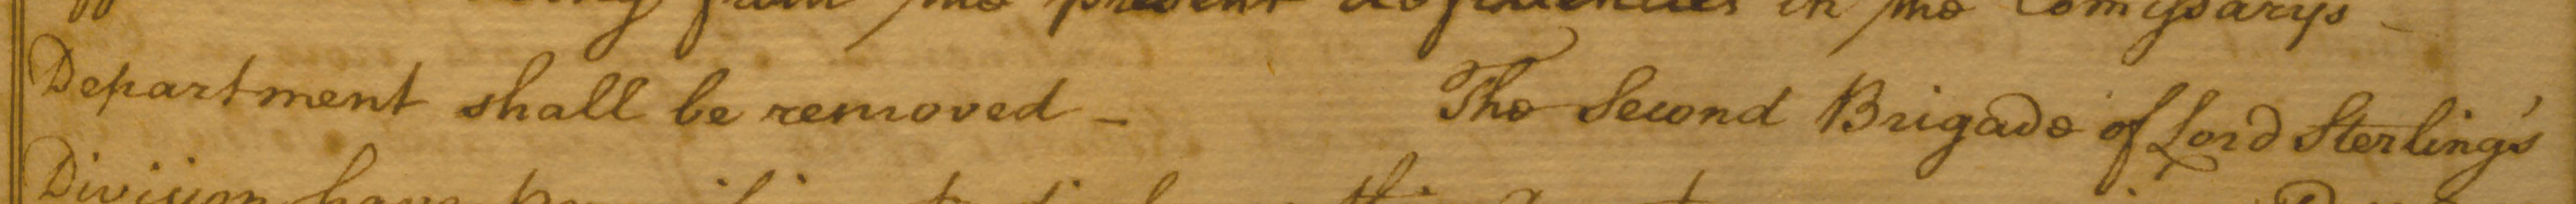Department shall be removed- The Second Brigade of Lord Sterling's
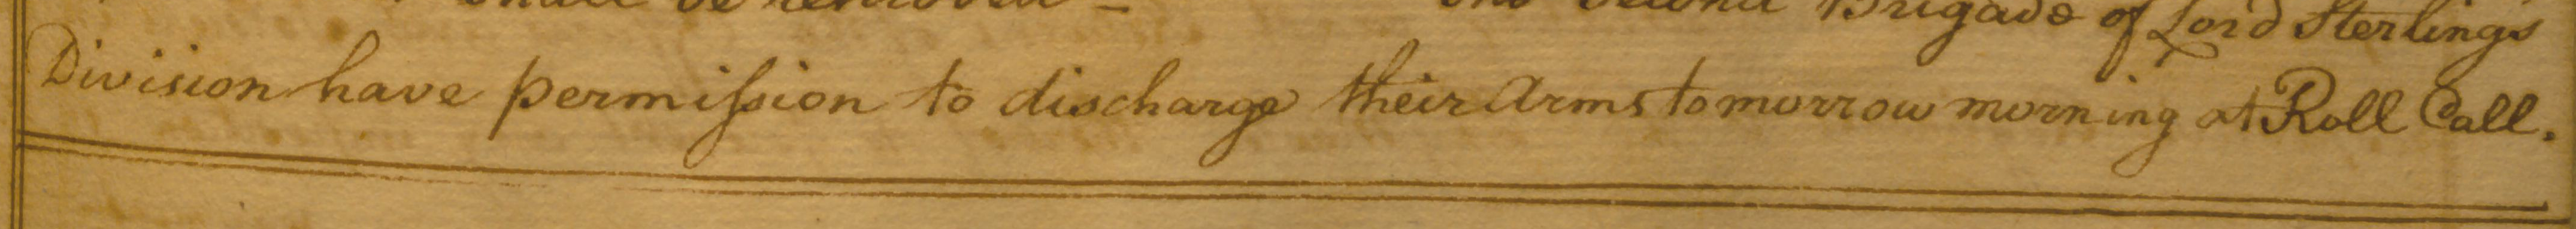Division have permission to discharge their Arms tomorrow morning at Roll Call.
